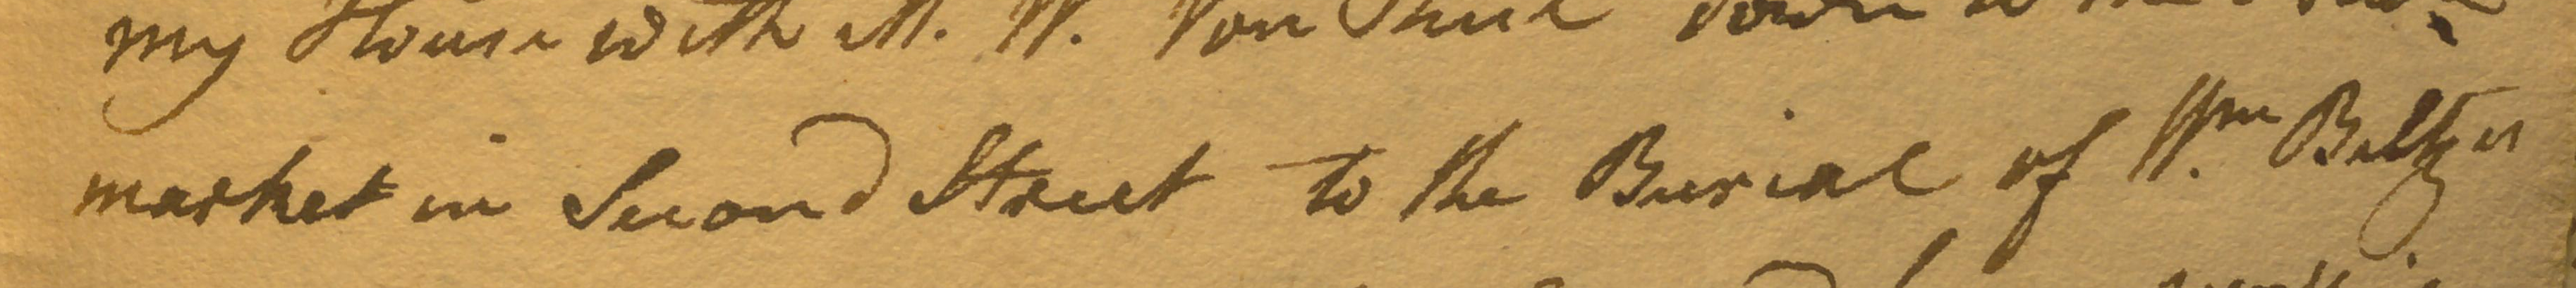market in second Street to the Burial of W^m. Biltzes
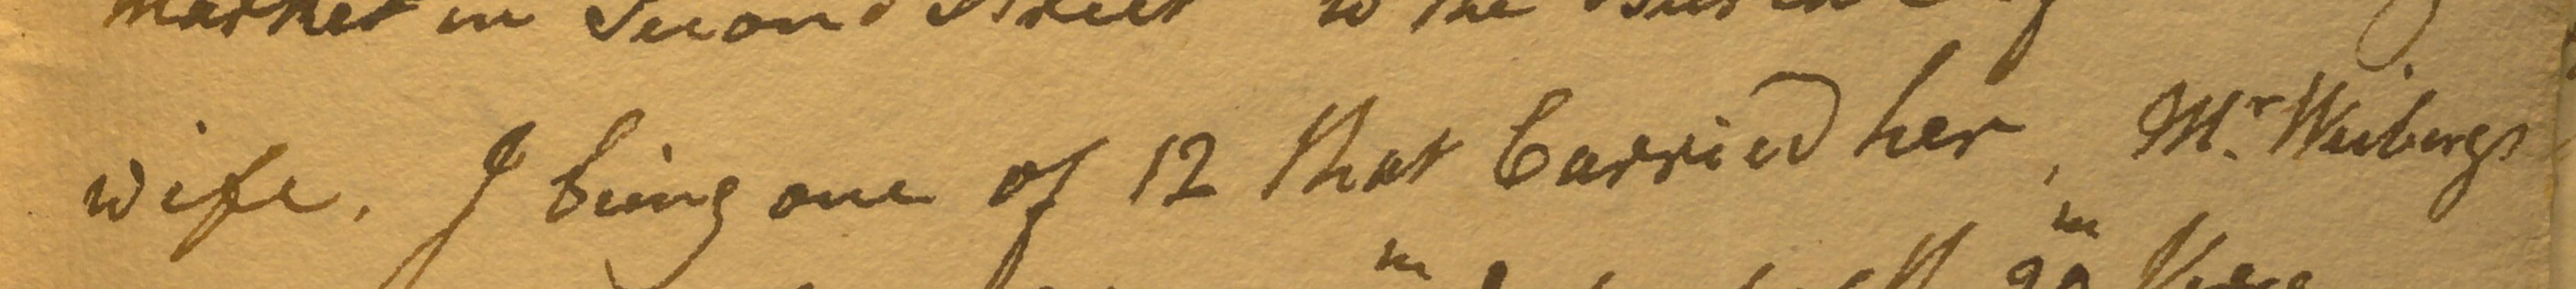wife, I being one of 12 that Carried her, M^r. Weibergs
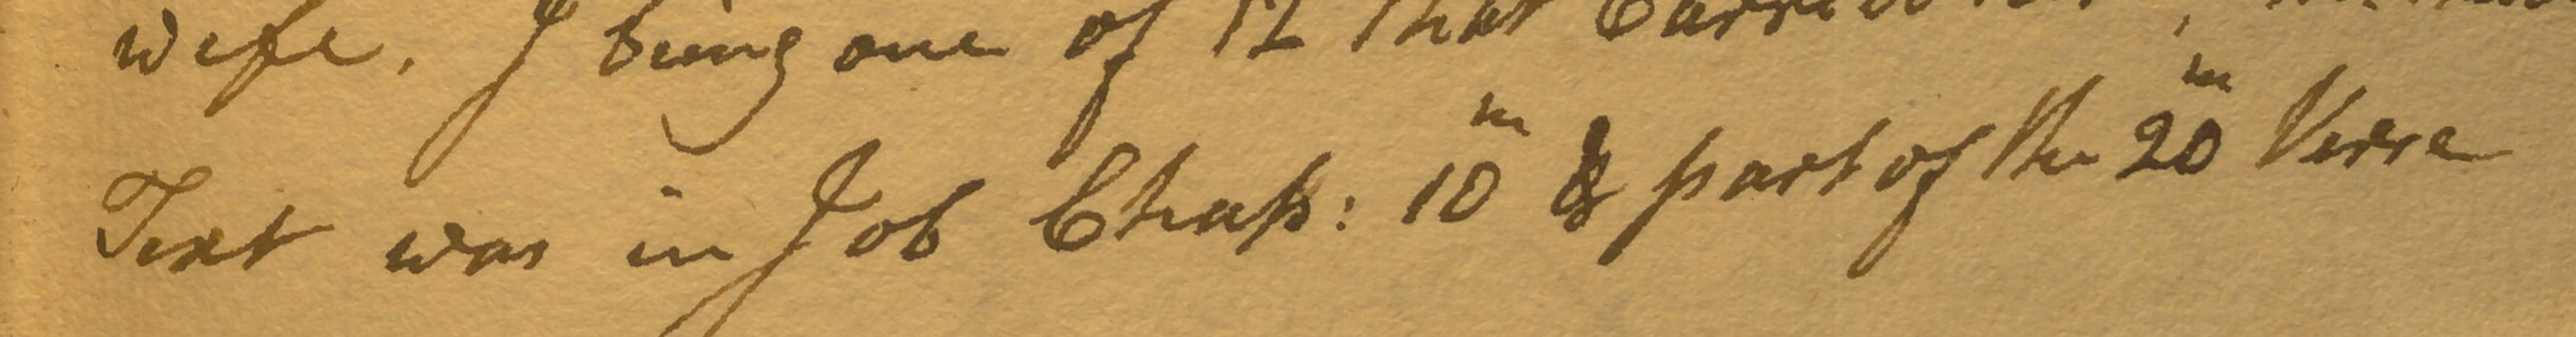Text was in Job Chap: 10^th & part of the 20^th Verse
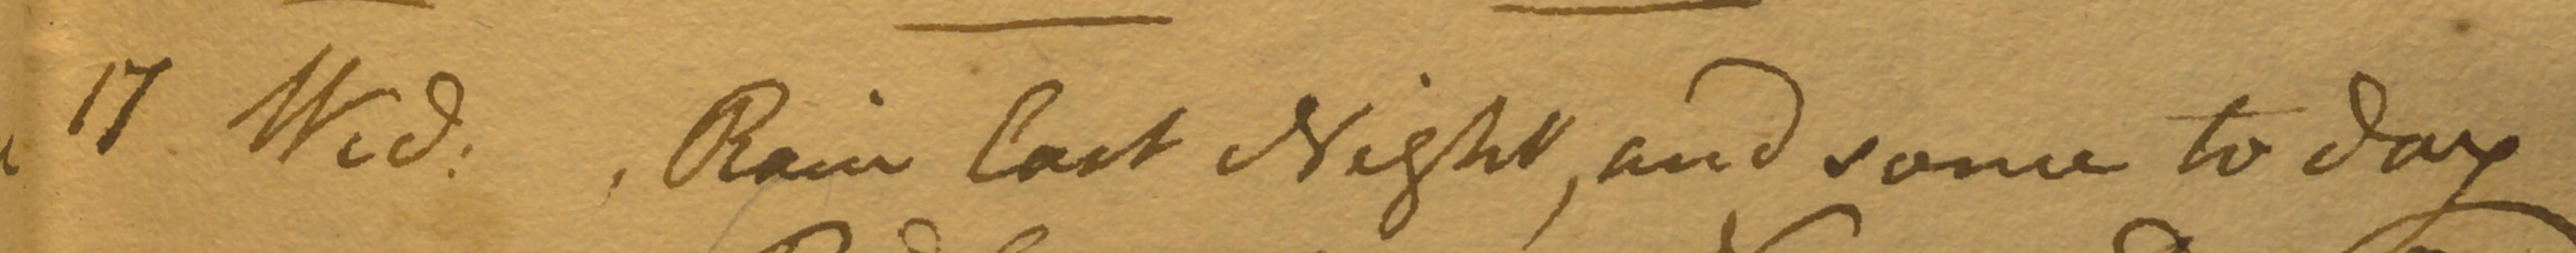17 Wed:, Rain last Night, and some to day
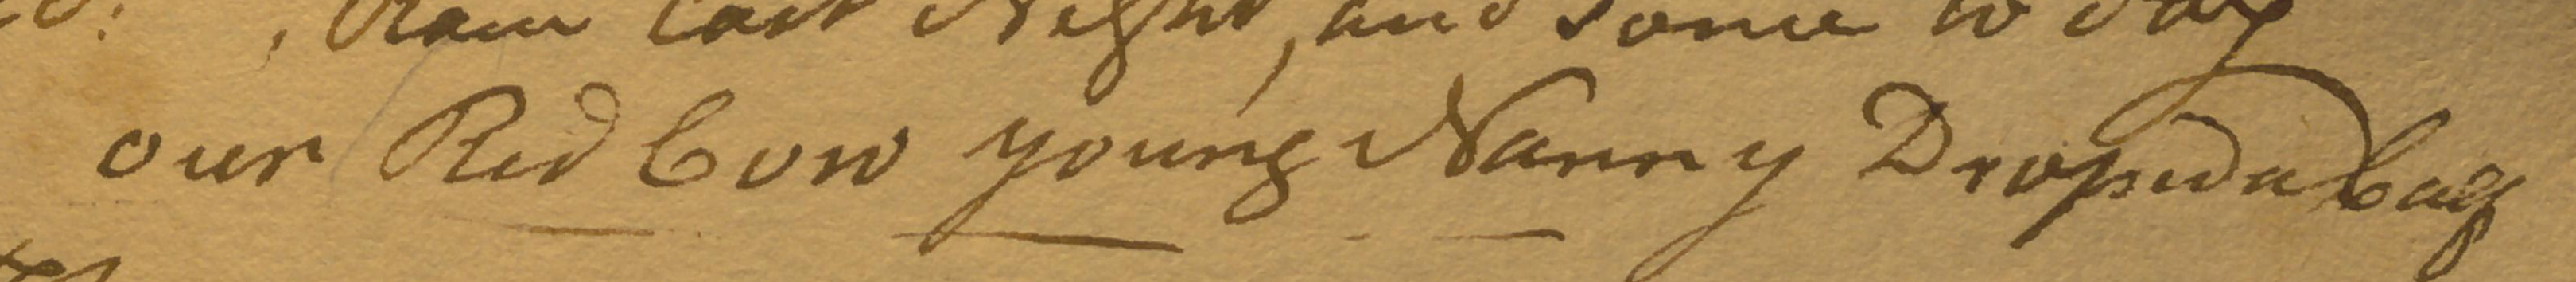our Red Cow young Nanny Droped a Calf
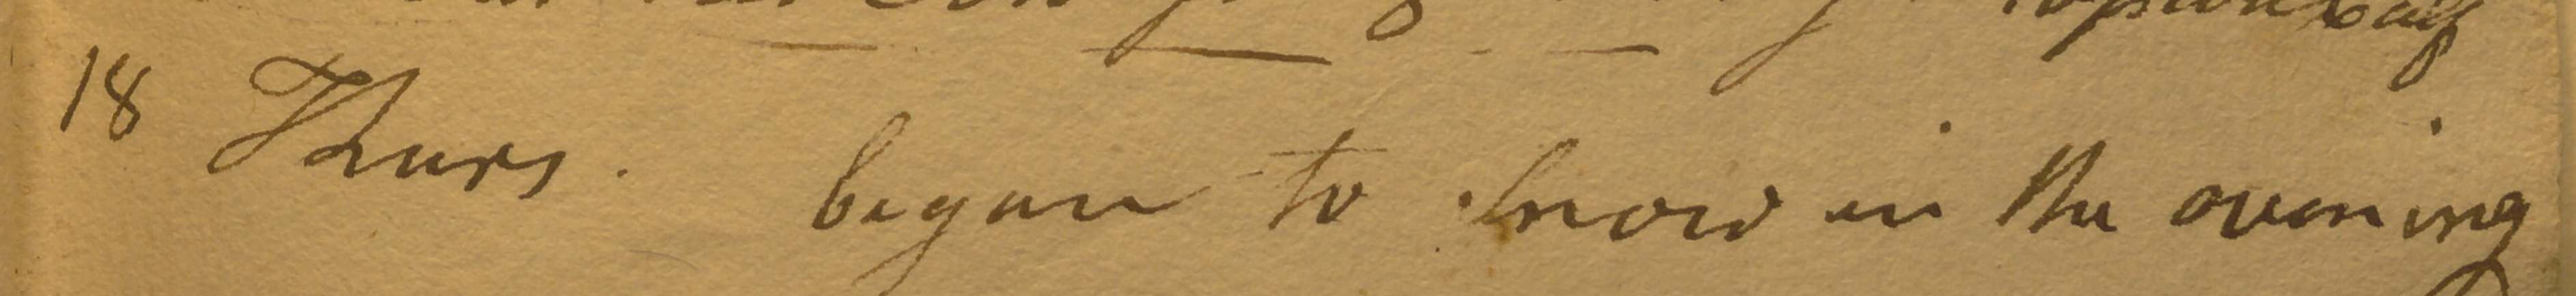18 Thurs. began to snow in the evening
